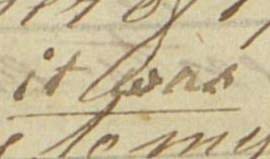it was
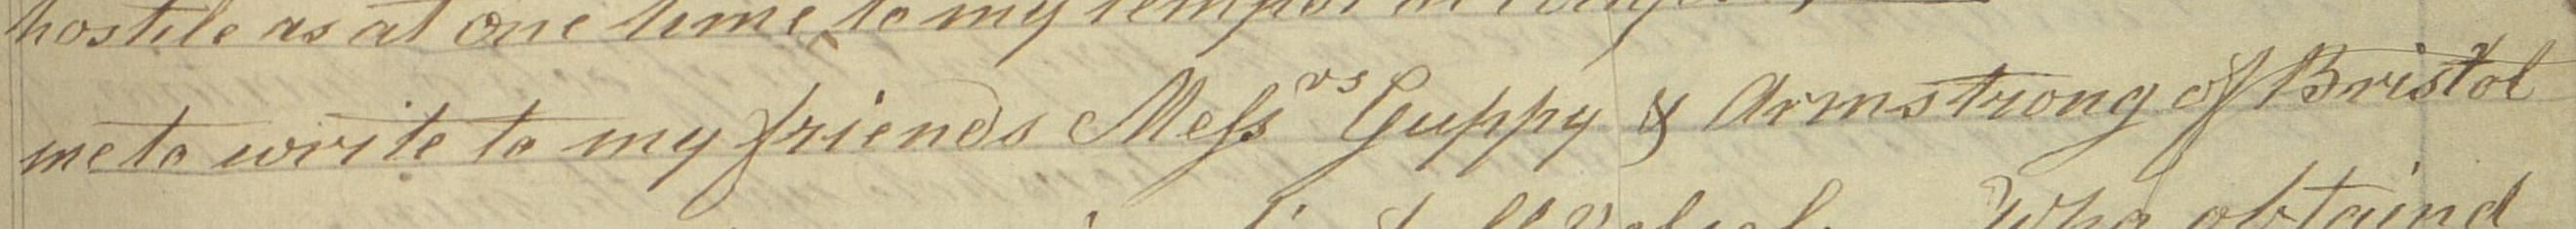me to write to my friends Mess^rs. Guppy & Armstrong of Bristol
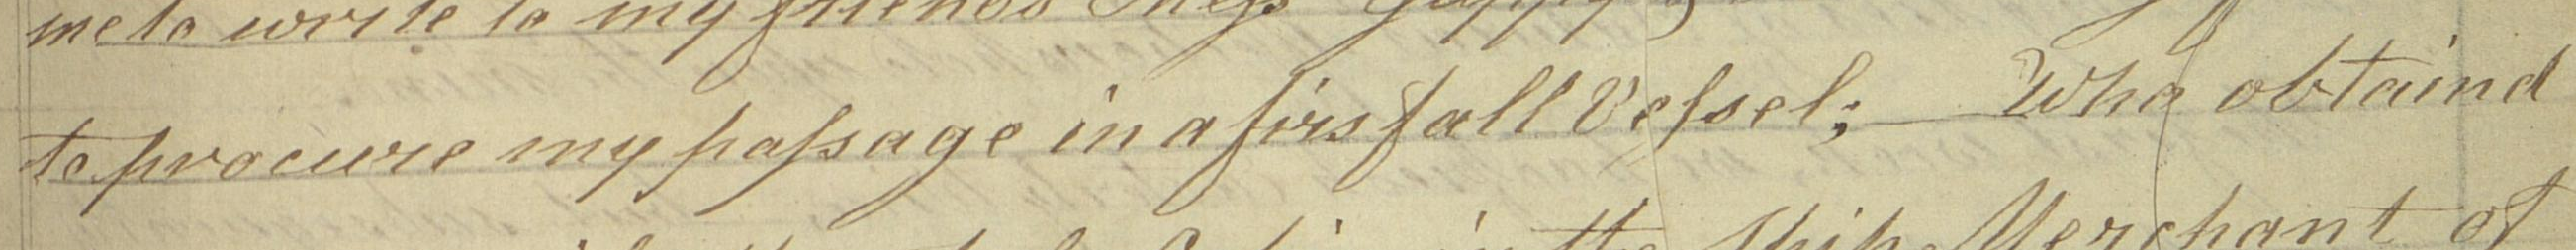to procure my passage in a firs fall Vessel; Who obtaind
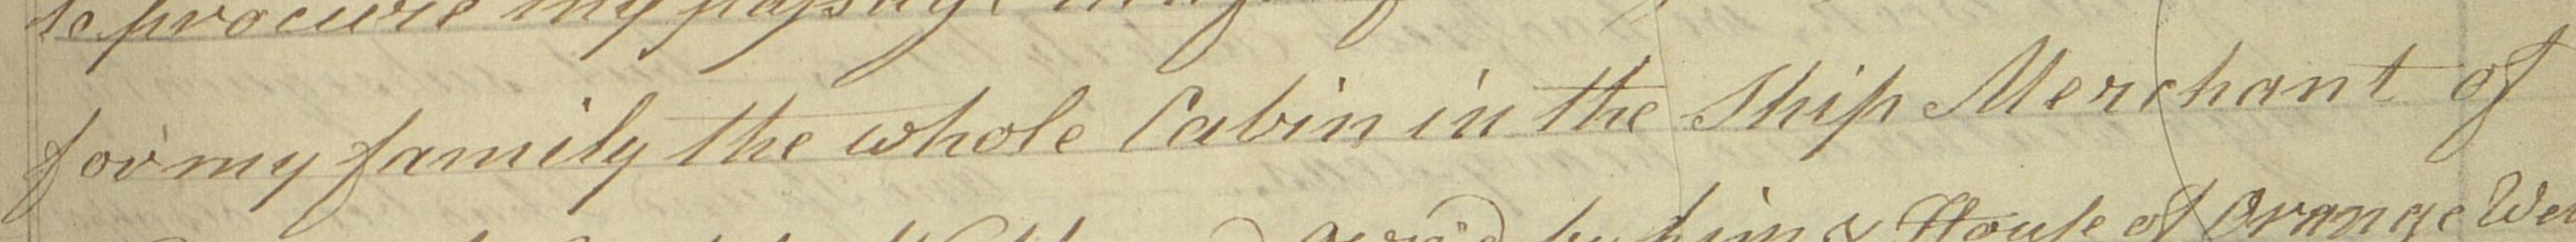for my family the whole Cabin in the Ship Merchant of
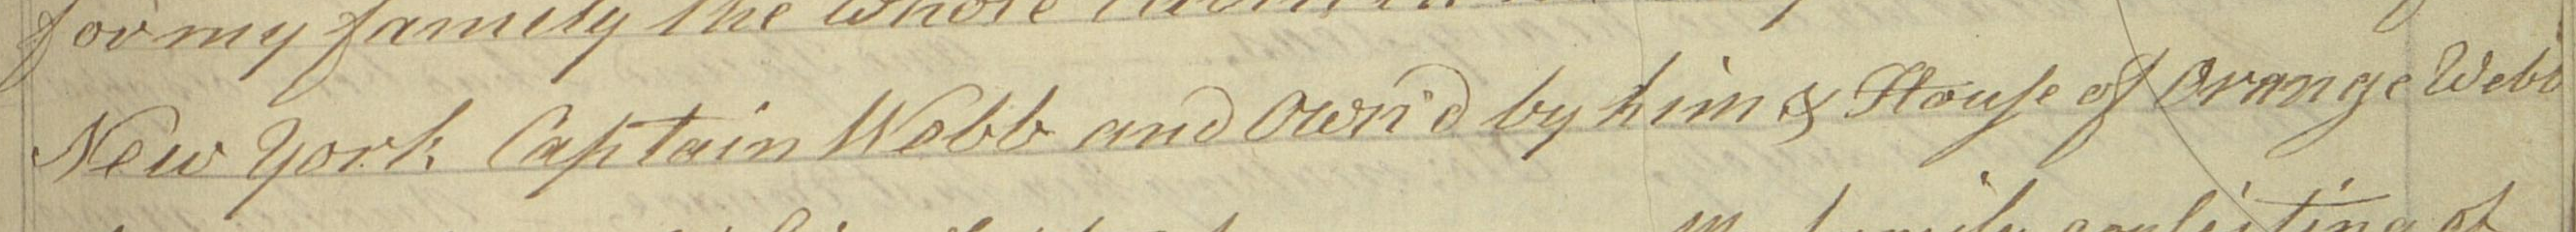New York Captain Webb and Own'd by him & House of Orange Webb
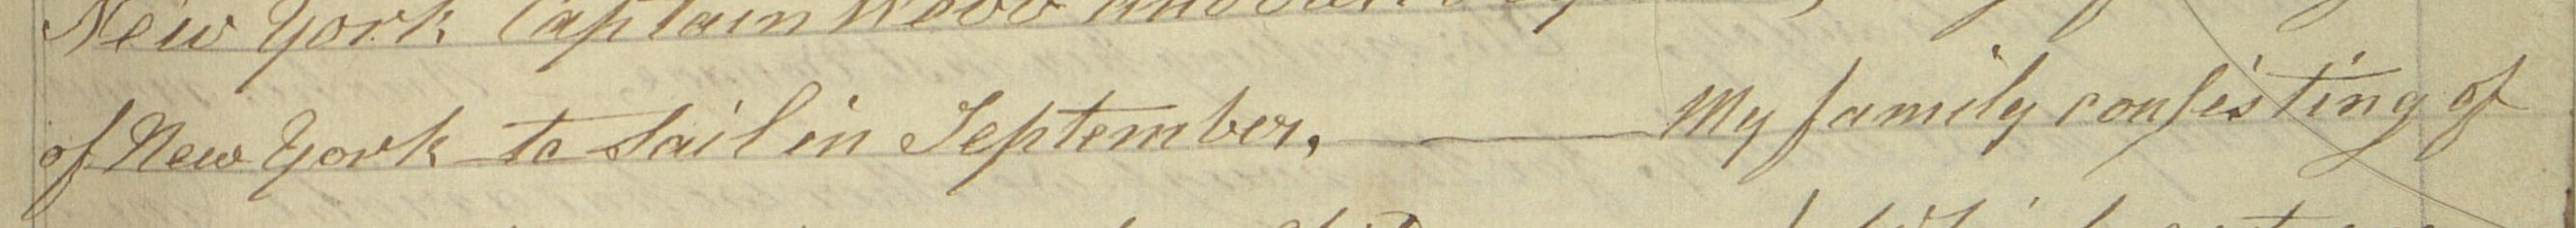of New York to Sail in September, My family consisting of
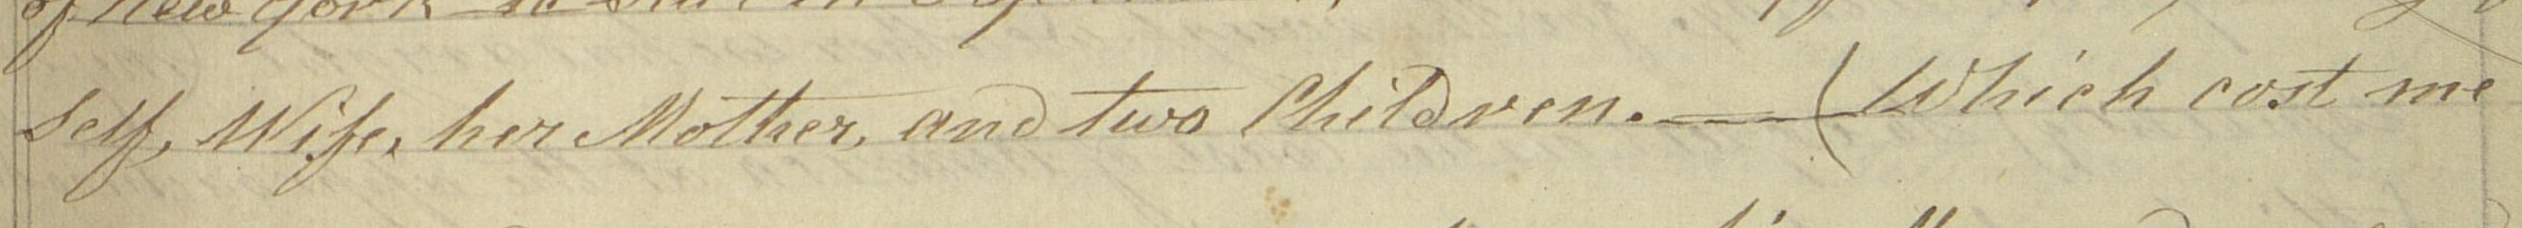Self, Wife, her Mother and two Children. (Which cost me
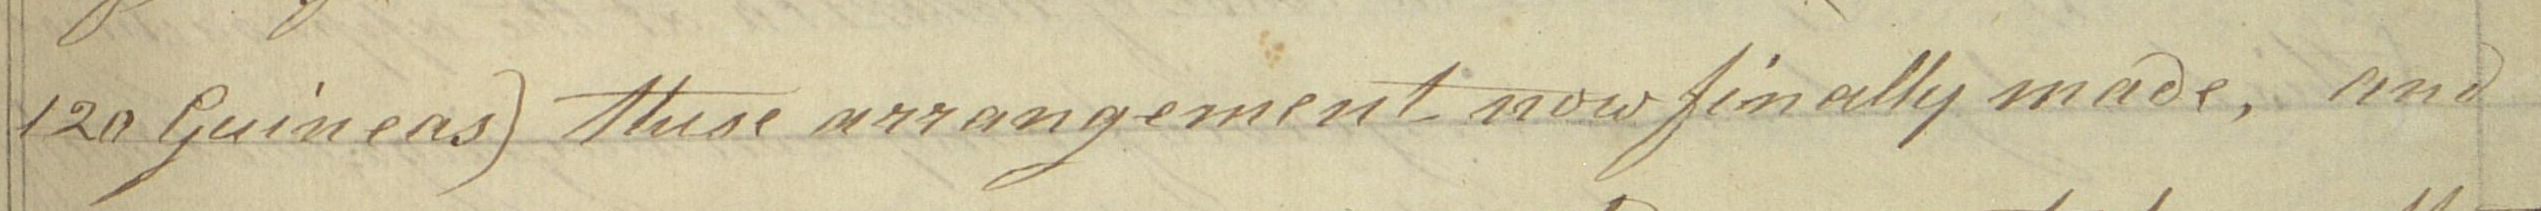120 Guineas) these arrangement now finally made, and
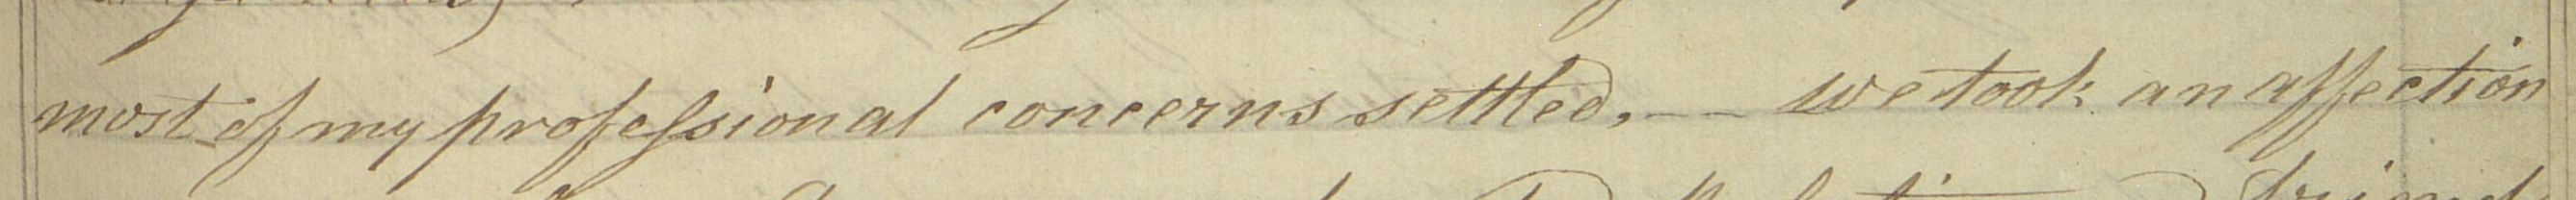most of my profession at concerns settled, we took an affection
